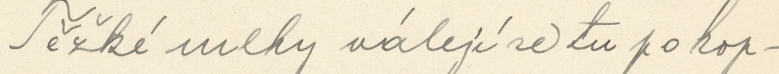Těžké mlhy válejí se tu po kop-
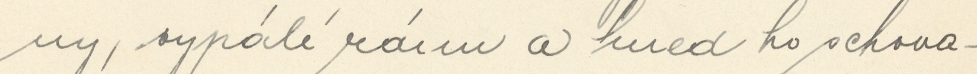ny, vypálí ránu a hned ho schova-
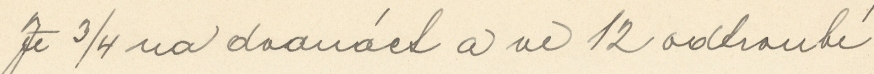Je 3/4 na dvanáct a ve 12 odtroubí
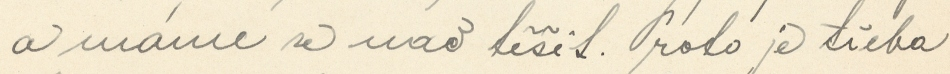a máme se nač těšit. Proto je třeba
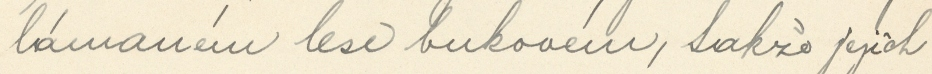lámaném lese bukovém, takže jejich
